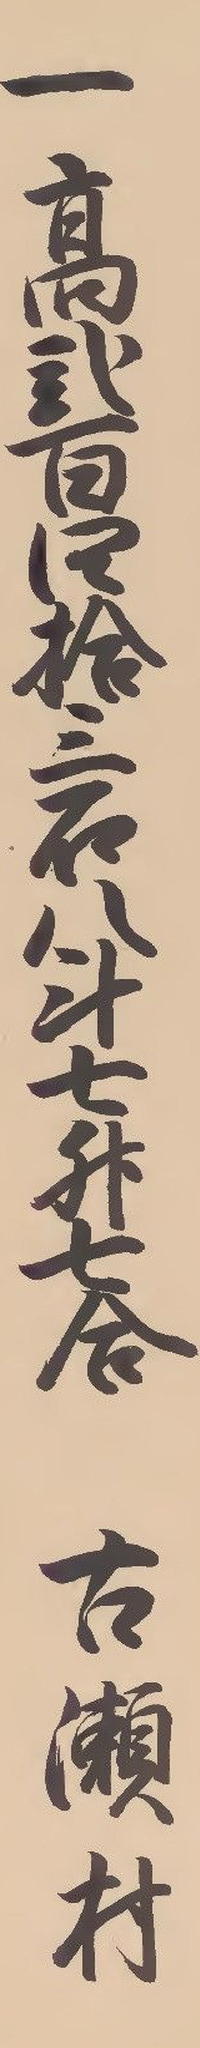一高弐百四拾三石八斗七升七合古瀬村

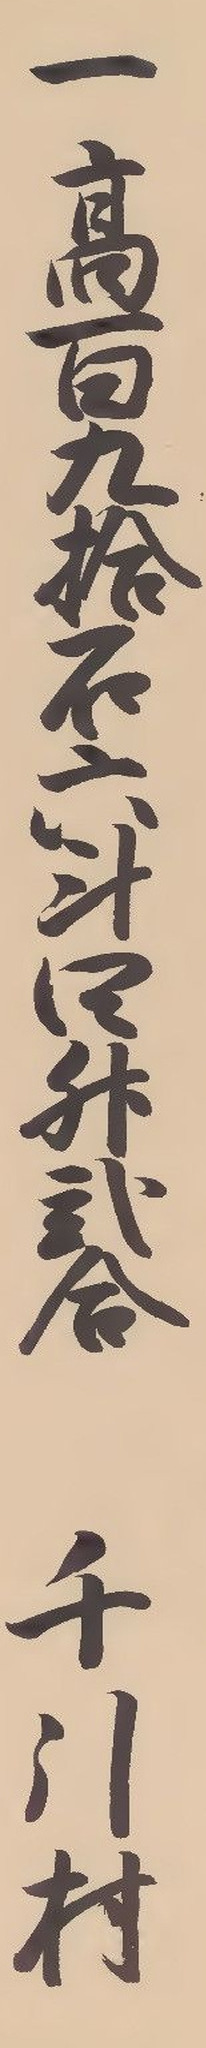一高百九拾石六斗四升弐合千引村
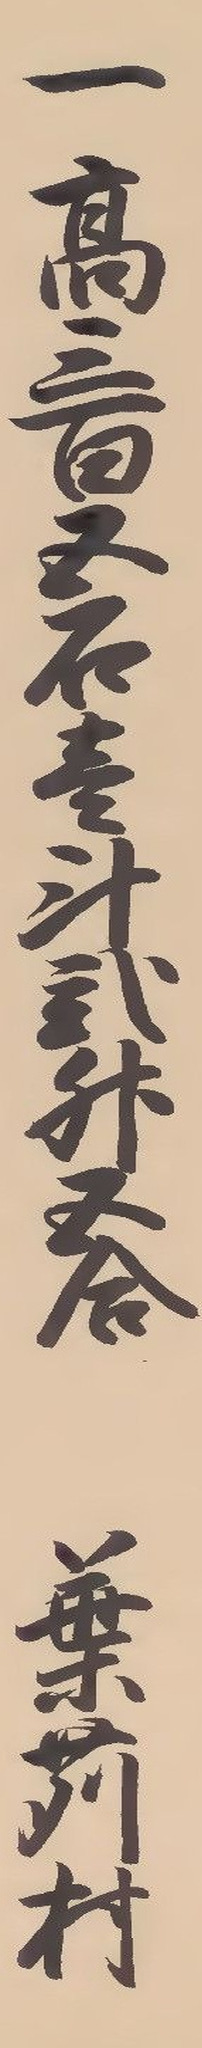一高三百五石壱斗弐升五合葉苅村
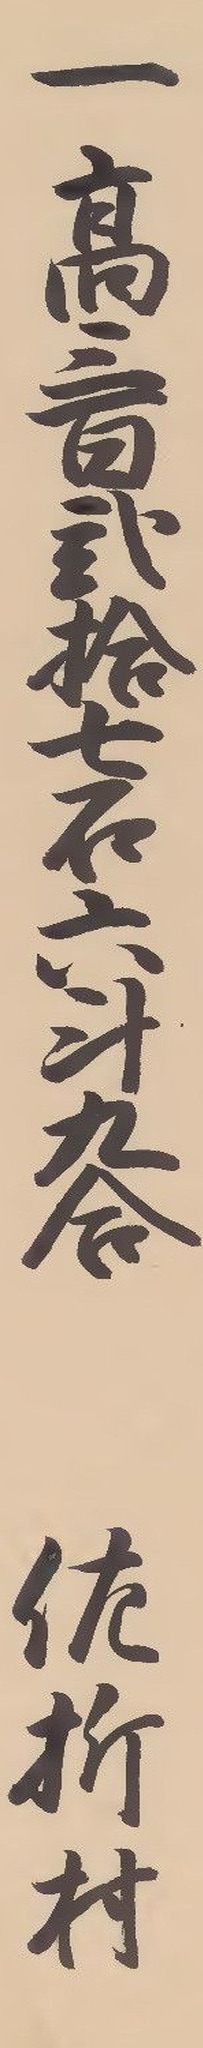一高三百弐拾七石六斗九合佐折村
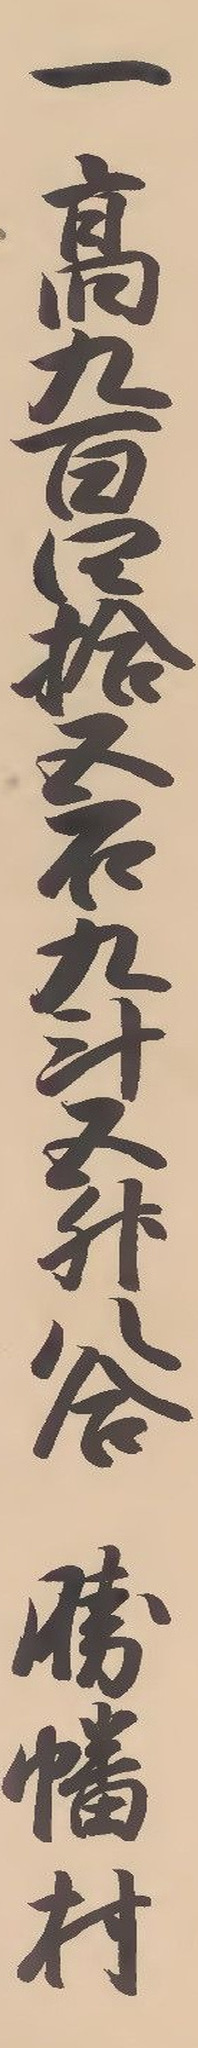一高九百四拾五石九斗五升八合勝幡村
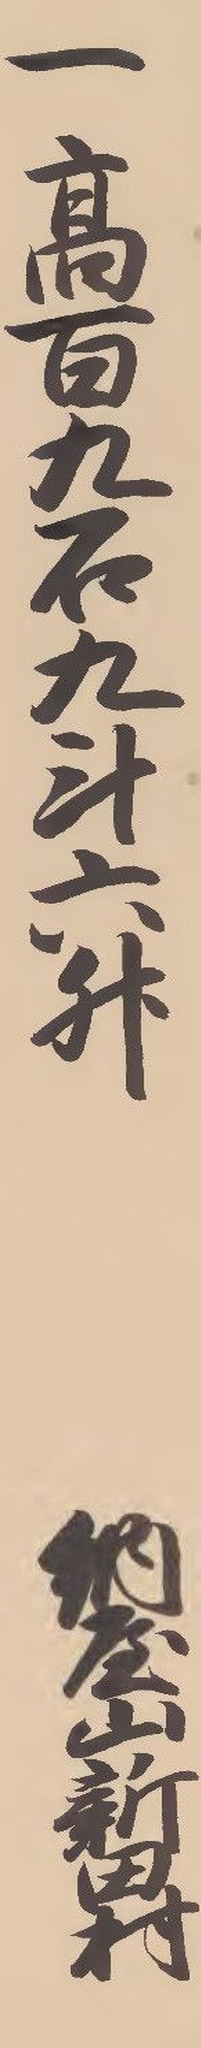一高百九石九斗六升納屋山新田村
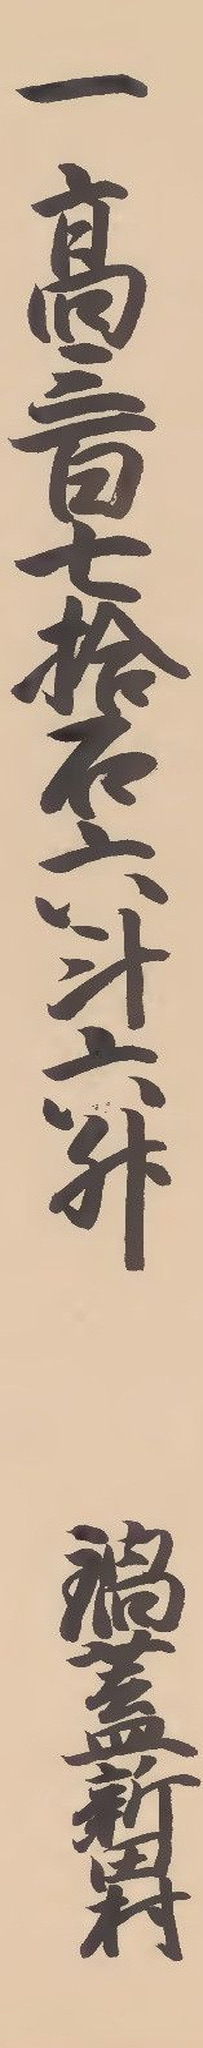一高三百七拾石六斗六升鍋蓋新田村
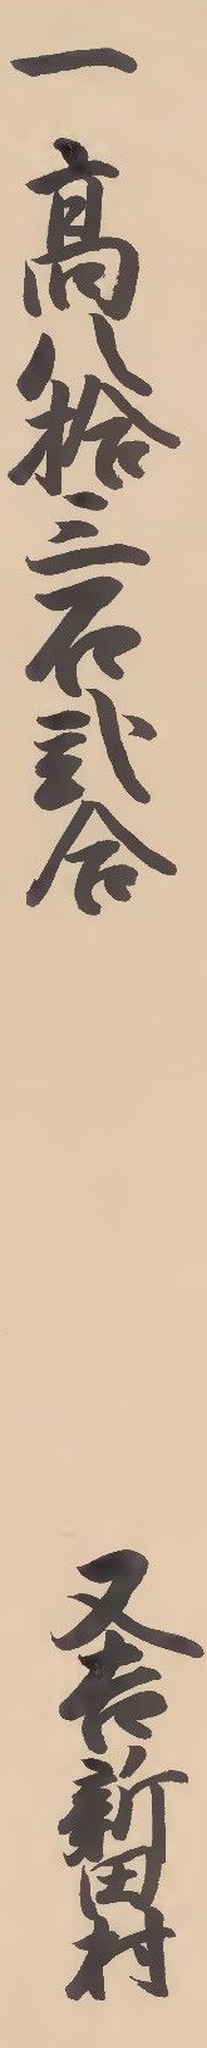一高八拾三石弐合又吉新田村
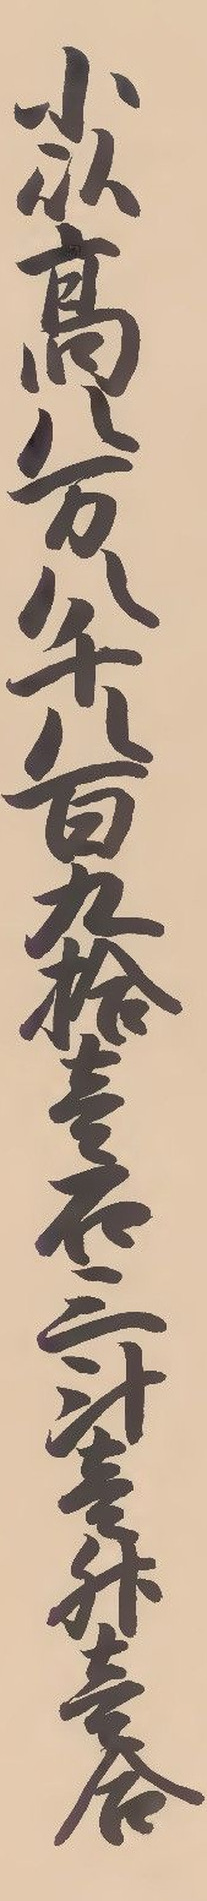小以高八万八千八百九拾壱石三斗壱升壱合

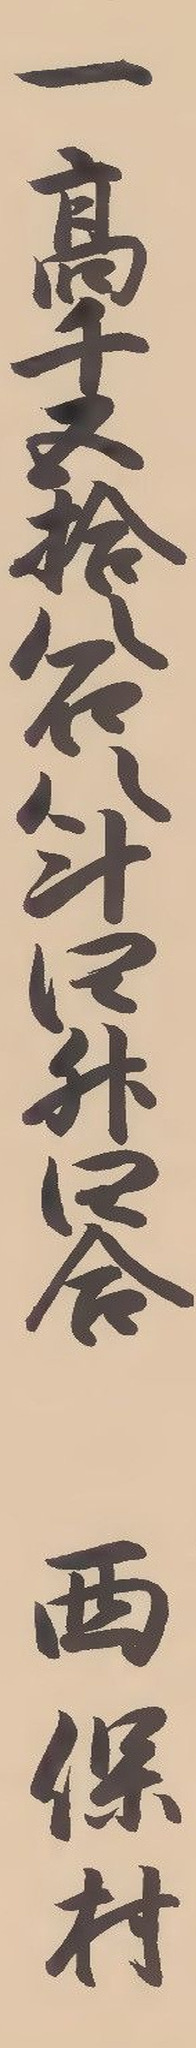一高千五拾八石八斗四升四合西保村
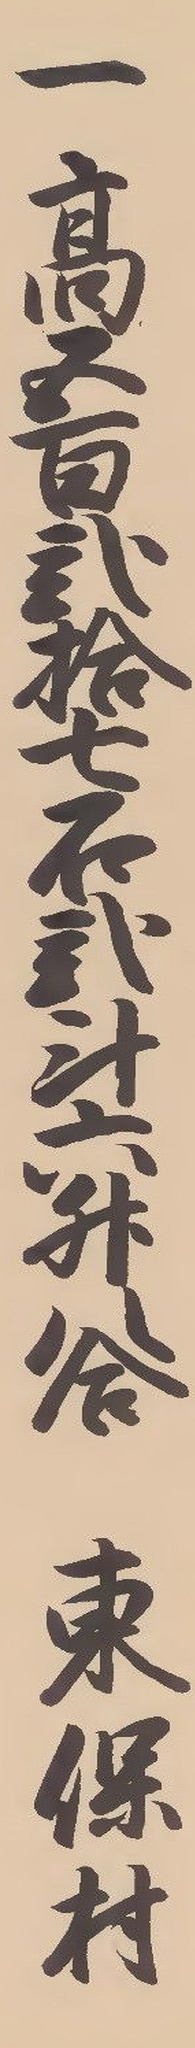一高五百弐拾七石弐斗六升八合東保村
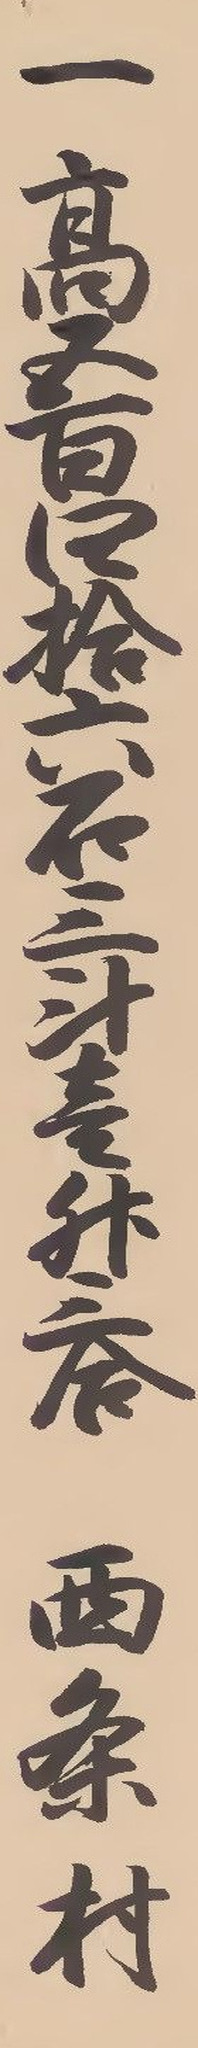一高五百四拾六石三斗壱升三合西条村

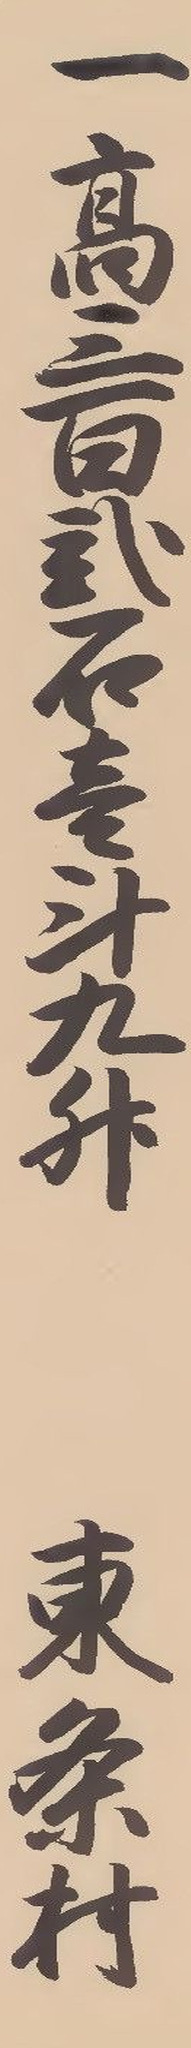一高三百弐石壱斗九升東条村
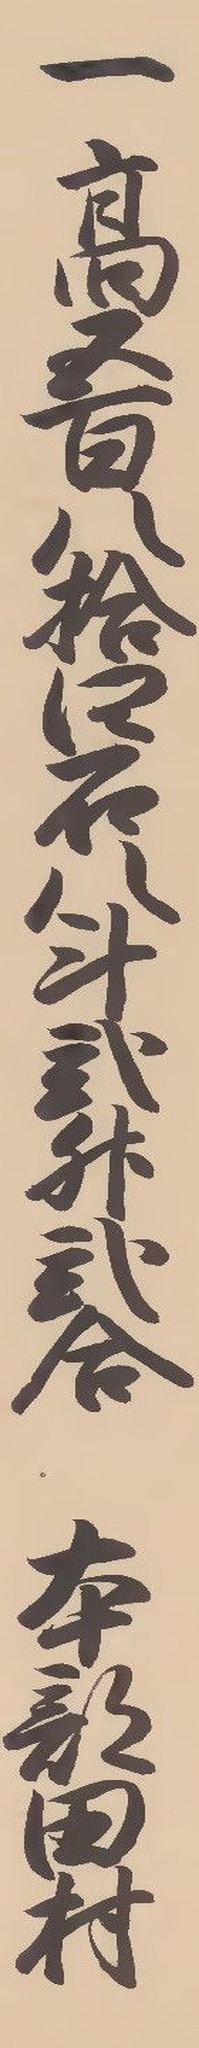一高五百八拾四石八斗弐升弐合本部田村
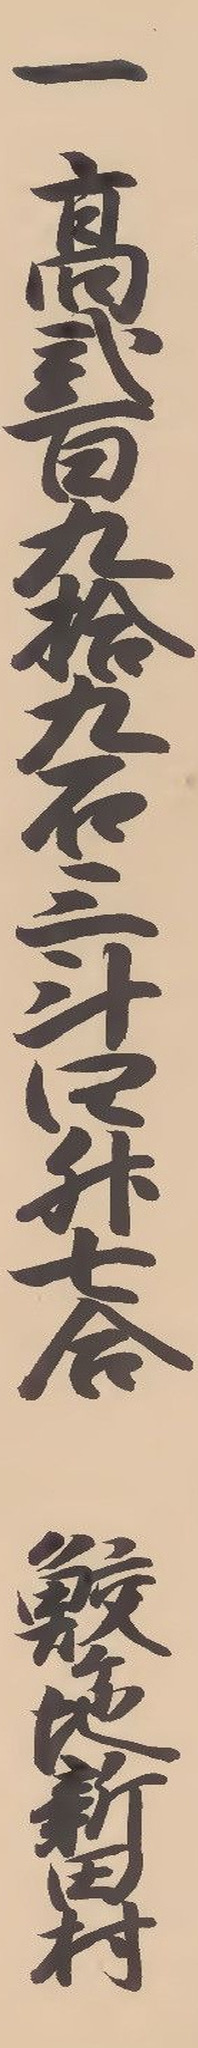一高弐百九拾九石三斗四升七合鮫ヶ池新田村
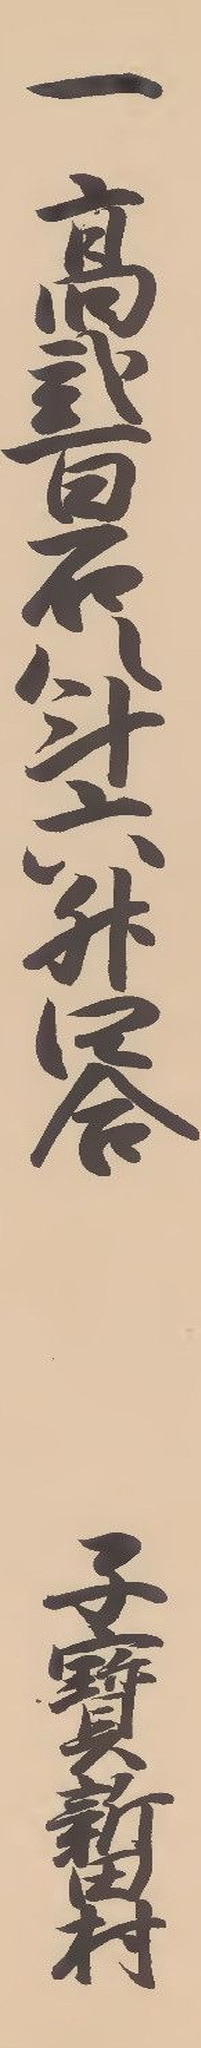一高弐百石八斗六升四合子宝新田村
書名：尾張国郷帳
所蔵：国立公文書館 National Archives of Japan
